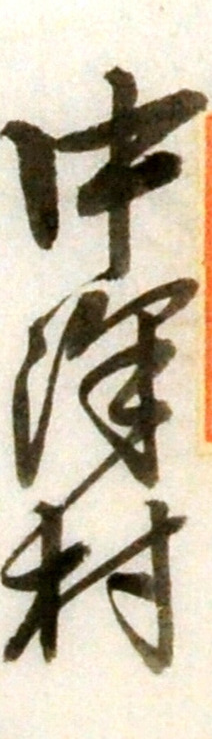中沢村
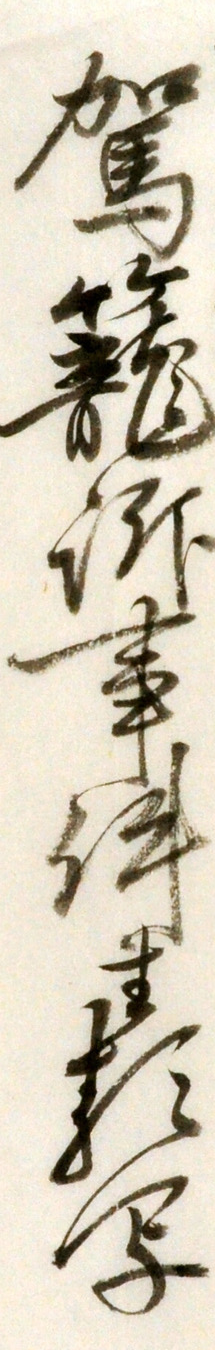駕籠訴事件書類写

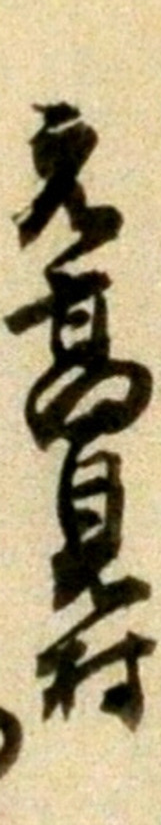元高見村
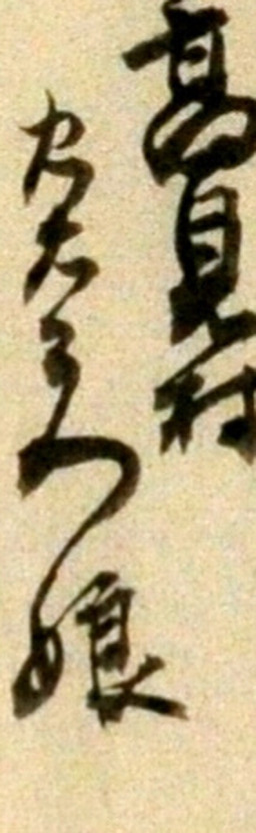忠右衛門娘
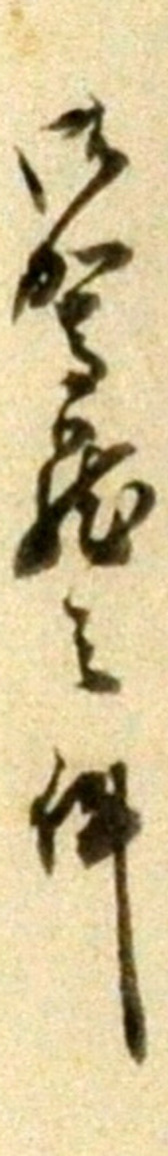御駕籠之件

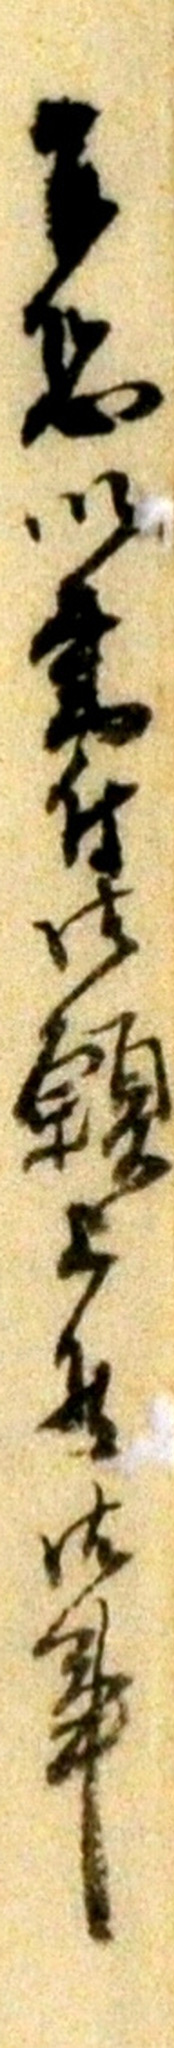乍恐以書付御願上候御事
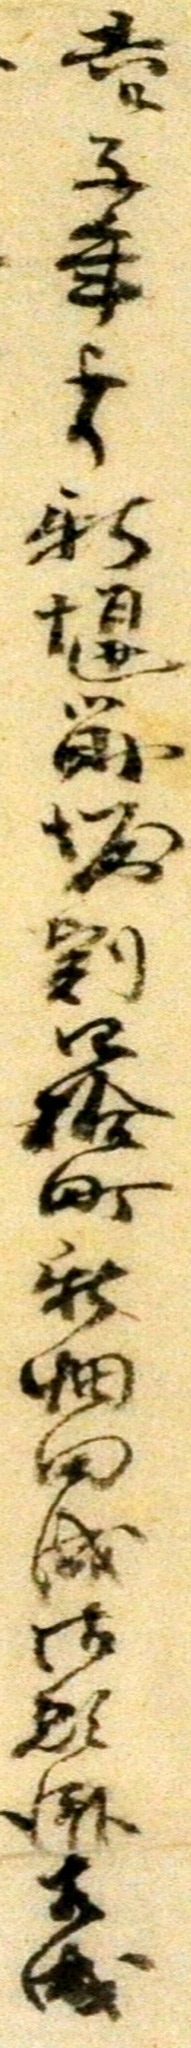去ㇽ子年上ィ新堰筋堀割四拾町新畑向成御願済相成
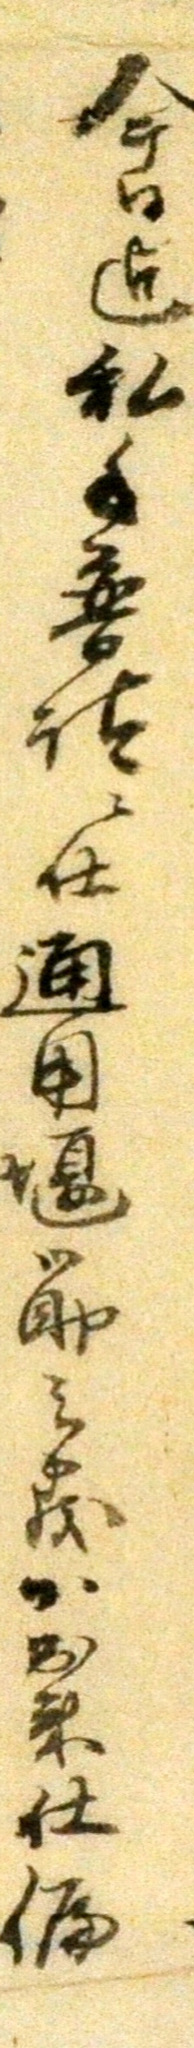今日迄私手普請ニ仕通用堰筋之義候出来仕偏
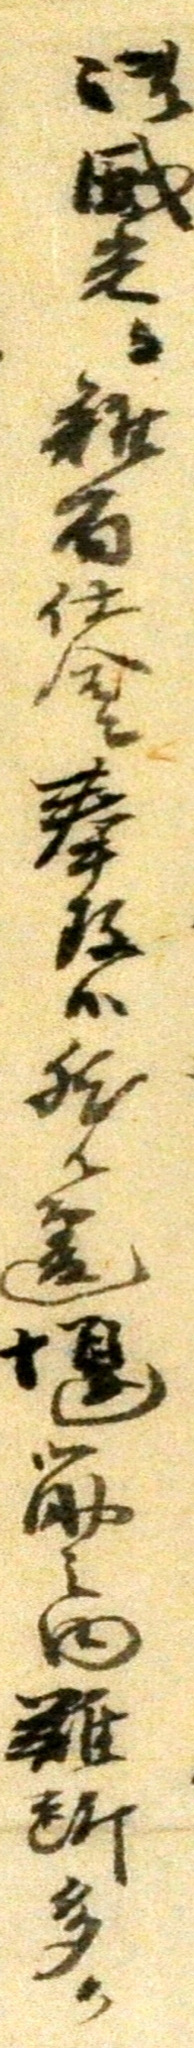御威光与難有仕合ニ奉存候然ㇽ尓違堰筋之内難所多ク
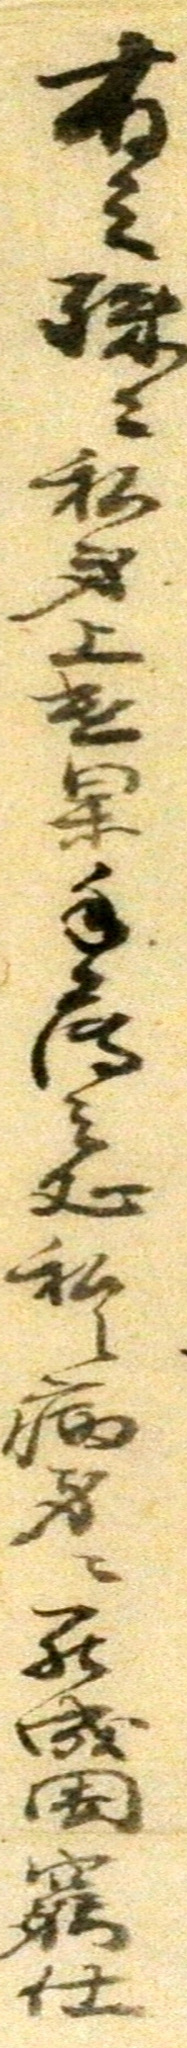有之殊ニ私身上遣果手薄之処私し病身ニ罷成困窮仕
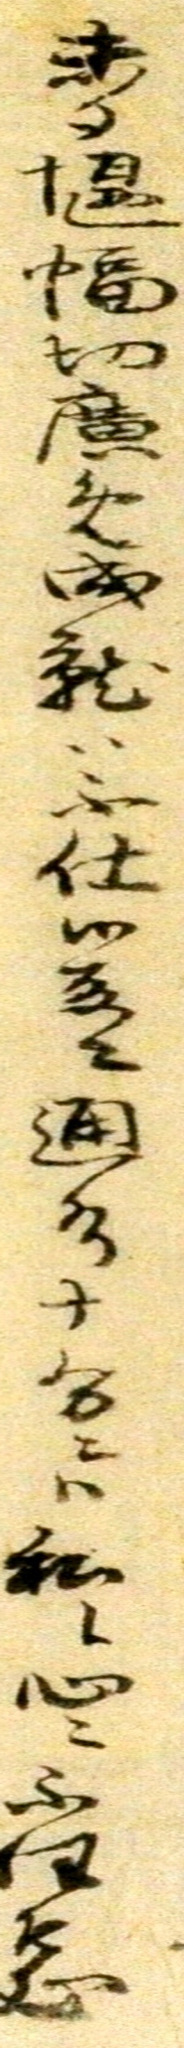未タ堰幅切広免成就ハ不仕候叓ニ通水十分ニハ私し心ニ不任処
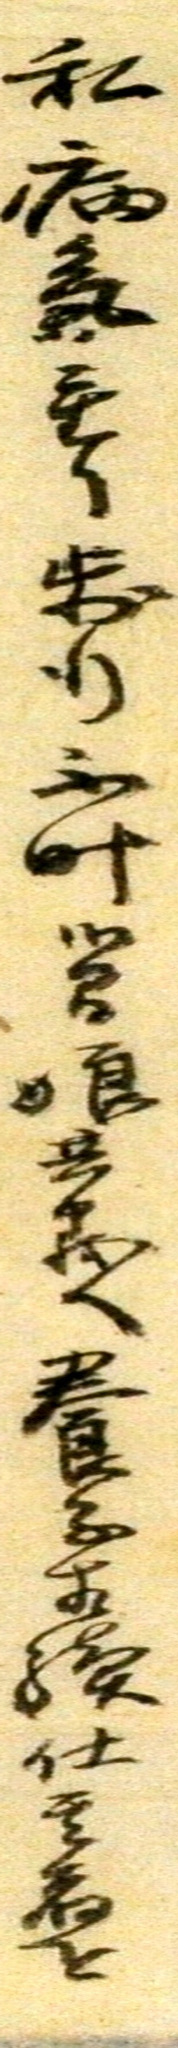私病気重り歩行不叶候間娘共義へ養子相続仕其者を
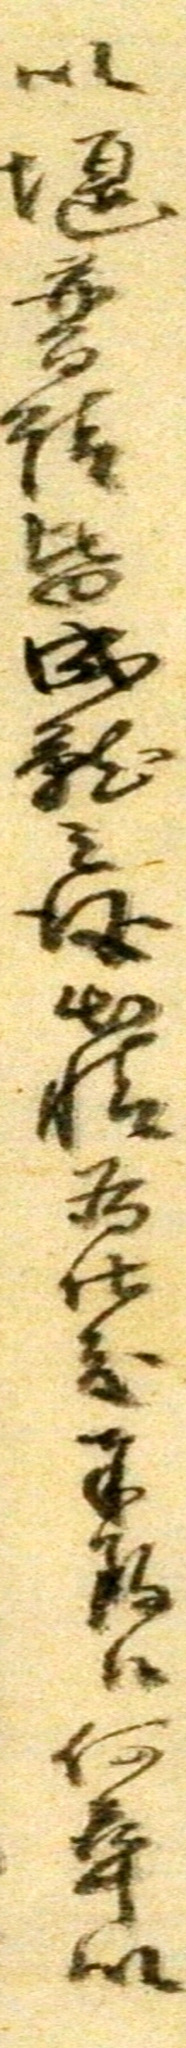以堰普請皆成就者被出精為仕度奉存候何卒以
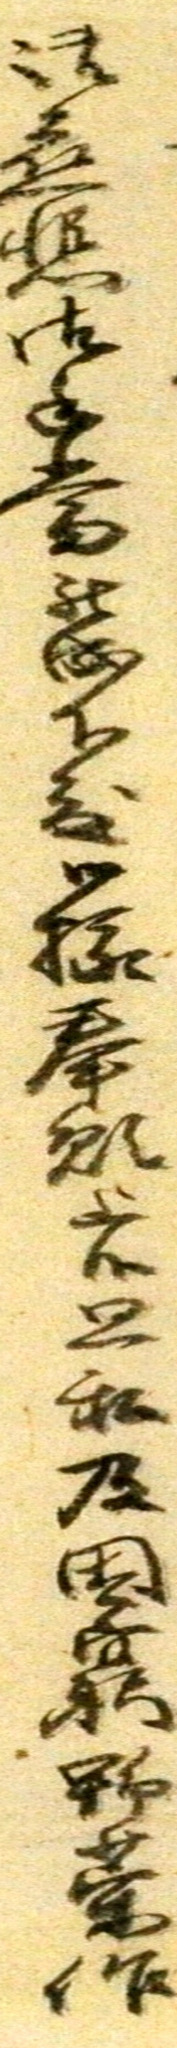御慈悲御手当被成下度候様奉願上候且私及困窮野菜作
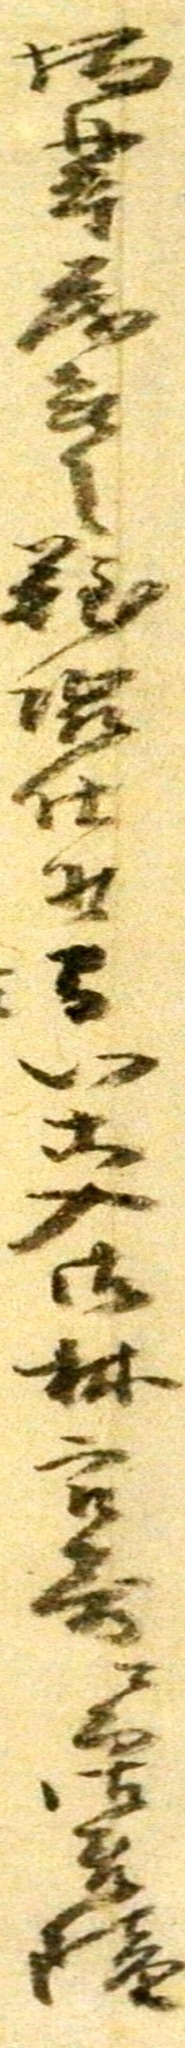場草茂無之難渋仕候間い古入御林最寄ニ而御普請
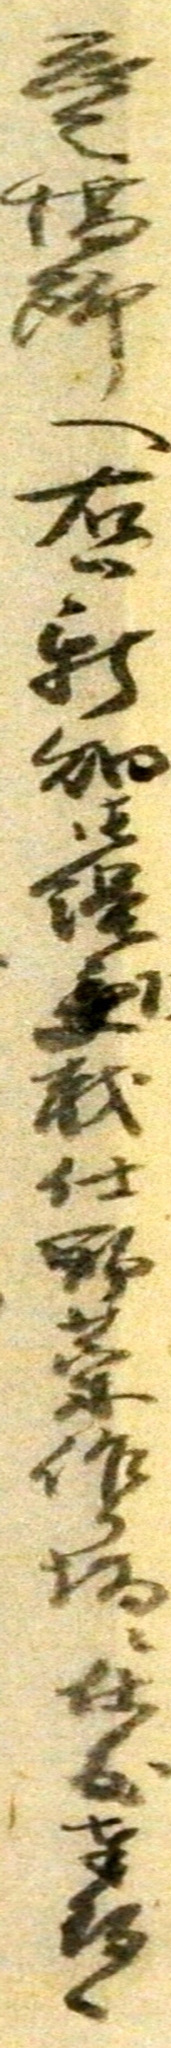無之場所へ右ハ新畑頂戴仕野菜作り場ニ仕度奉存候
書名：中沢村駕籠訴事件書類写
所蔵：伊那市立高遠町図書館・合同会社AMANE
